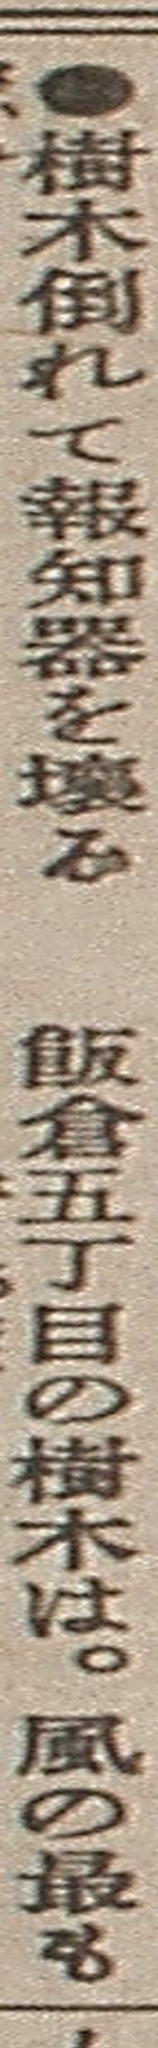●樹木倒れて報知器を壊る飯倉五丁目の樹木は。風の最も
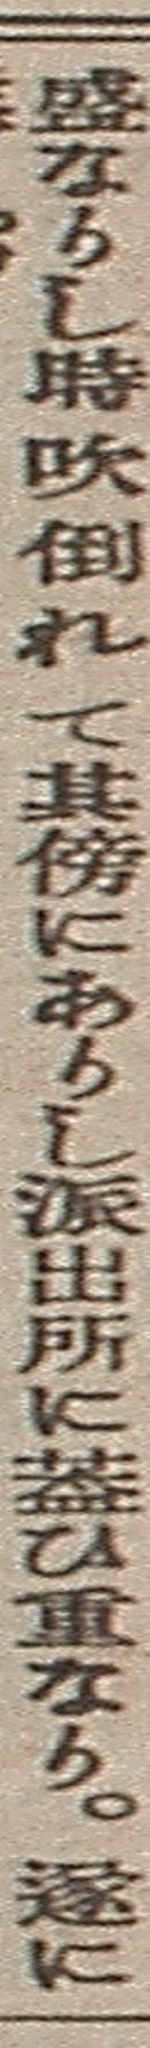盛なりし時吹倒れて其傍にありし派出所に蓋ひ重なり。遂に
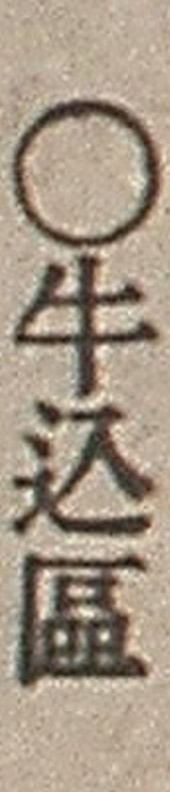〇牛込区
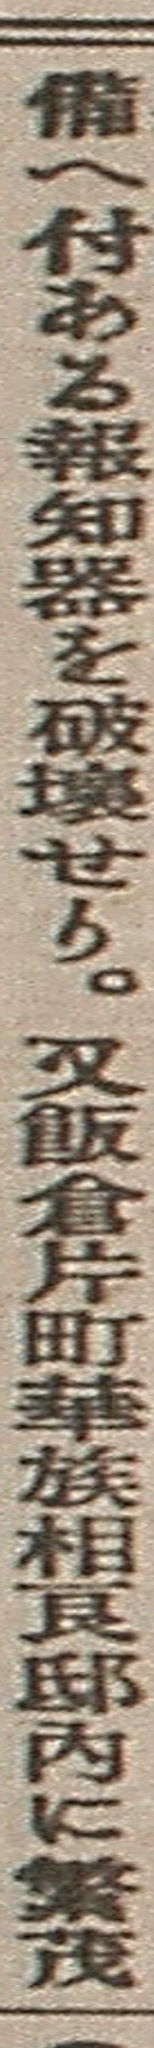備へ付ある報知器を破壊せり。又飯倉片町華族相良邸内に繁茂

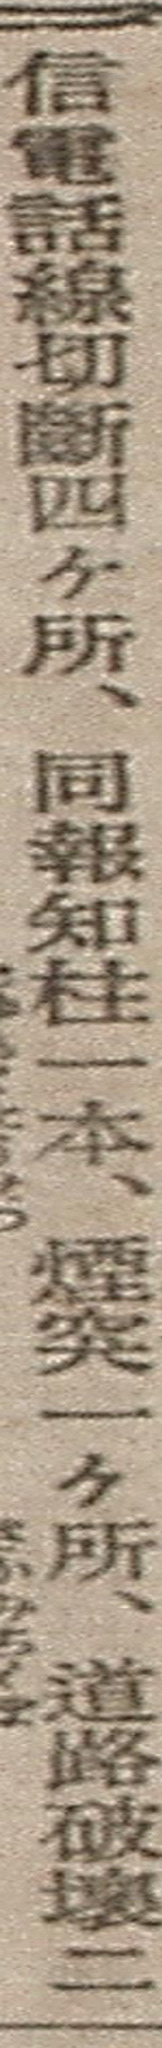信電話線切断四ケ所、同報知柱一本、煙突一ケ所、道路破壊二
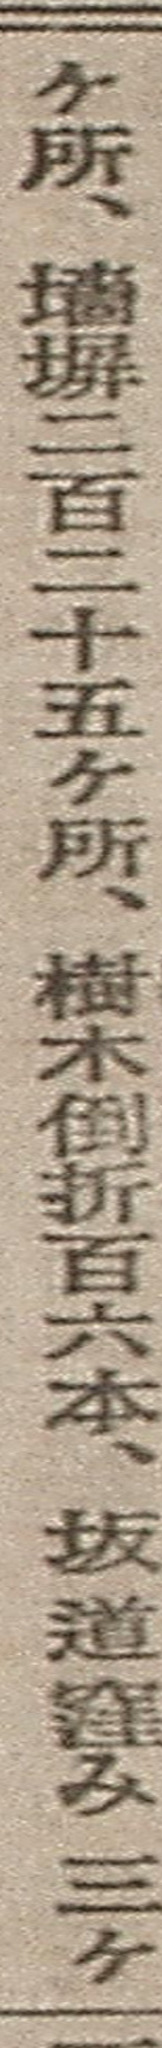ケ所、墻塀二百ニ十五ケ所、樹木倒折百六本、坂道窪み三ケ
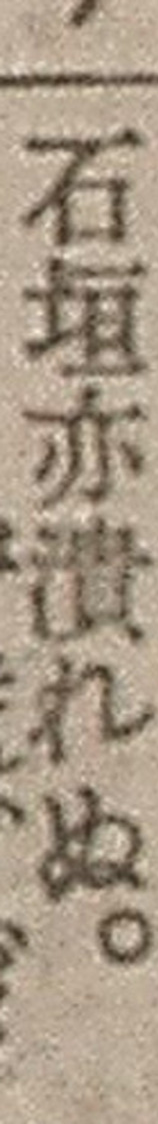石垣亦潰れぬ。
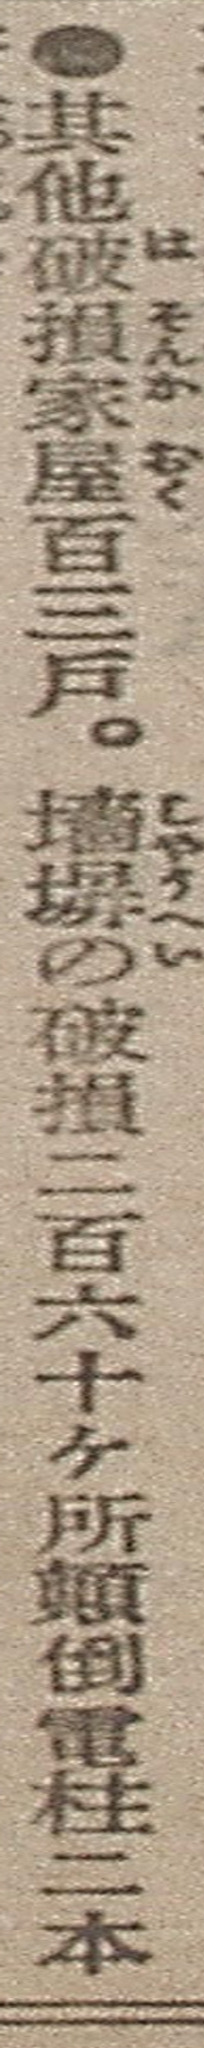●其他破損家屋百三戸。墻塀の破損二百六十ケ所顛倒電柱二本
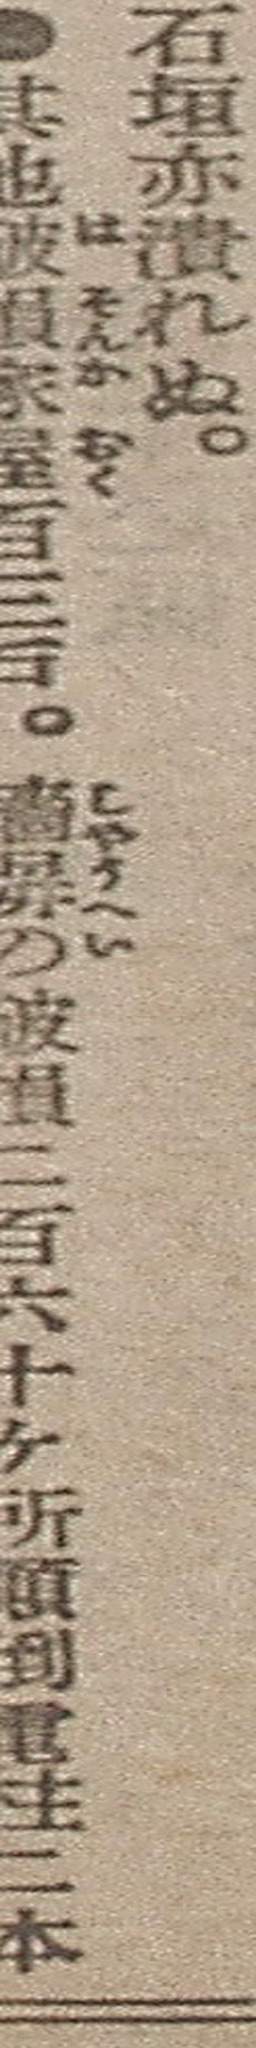●其他破損家屋百三戸。墻塀の破損二百六十ケ所顛倒電柱二本
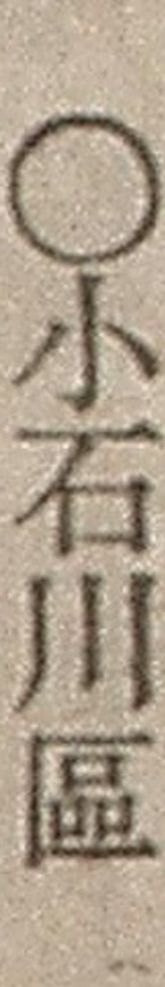〇小石川区
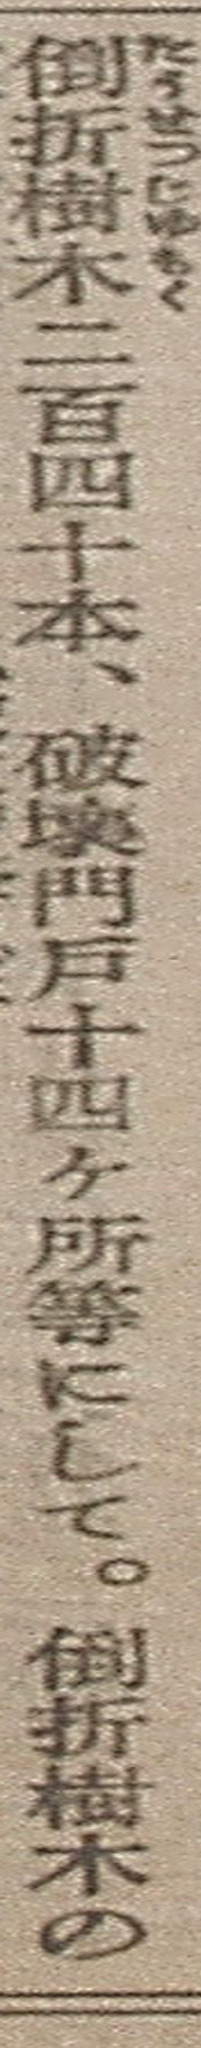倒折樹木二百四十本、破壊門戸十四ケ所等にして。倒折樹木の
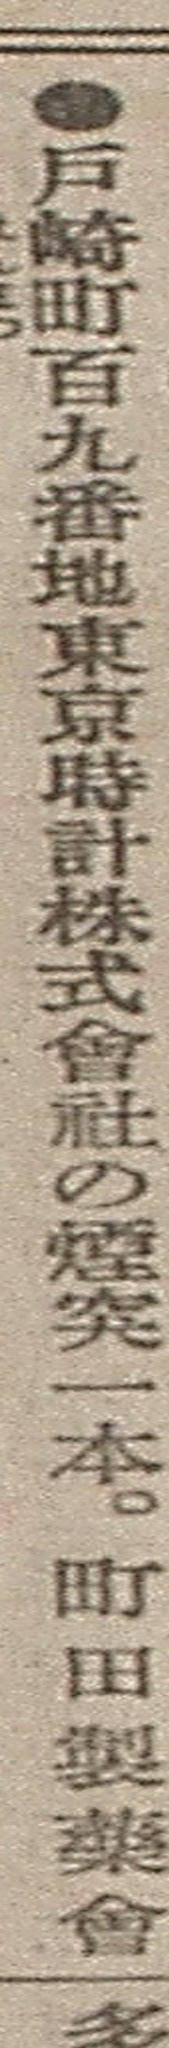●戸崎町百九番地東京時計株式会社の煙突一本。町田製薬会
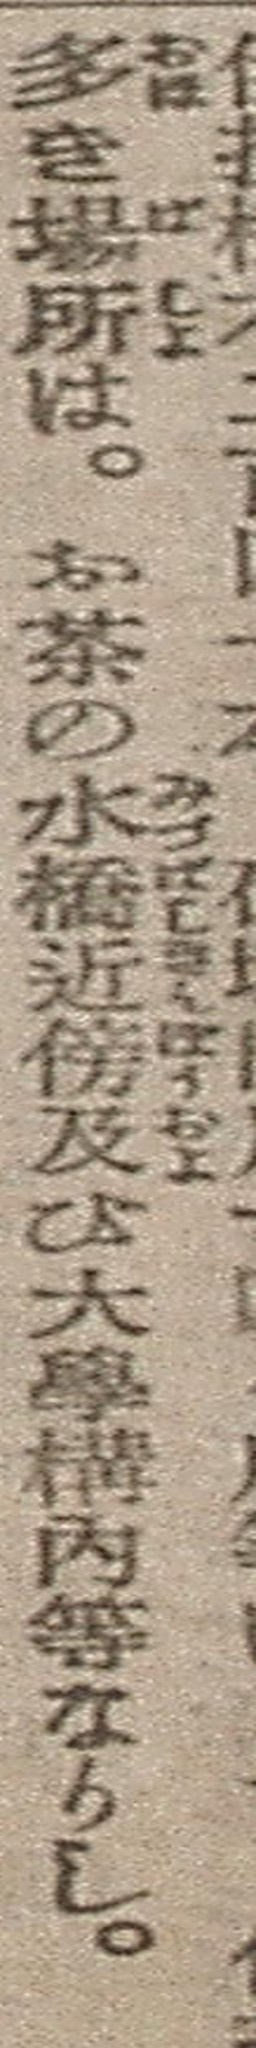多き場所は。お茶の水橋近傍及び大学構内等なりし。
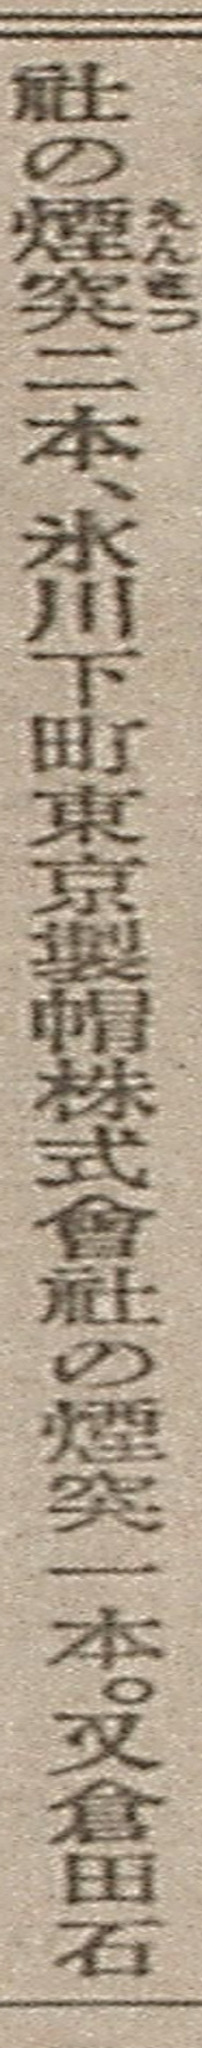社の煙突二本、氷川下町東京製帽株式会社の煙突一本。又倉田石
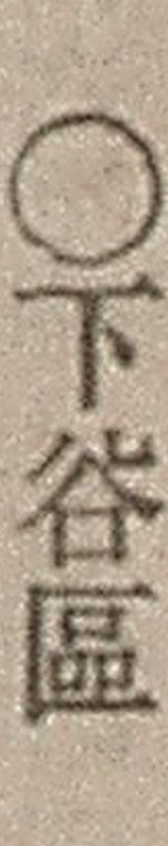〇下谷区
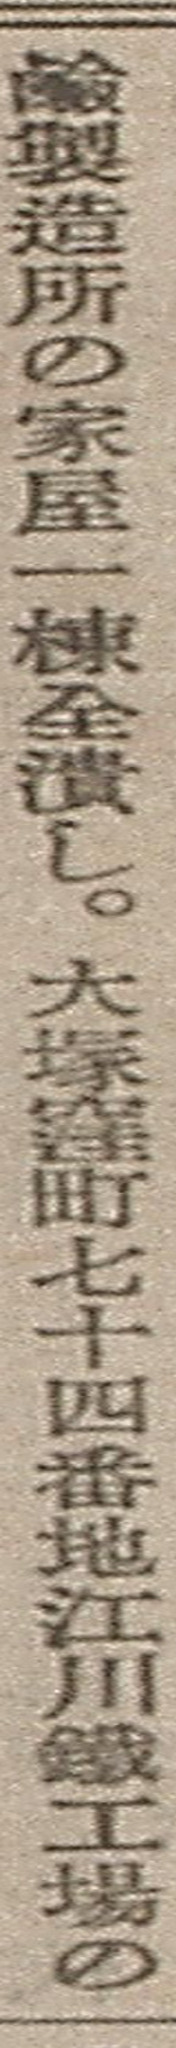鹸製造所の家屋一棟全潰し。大塚窪町七十四番地江川鉄工場の
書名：風俗畫報臨時増刊第百九十九號　明治三十二年十月各地災害圖會（前編之續）
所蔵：東京大学地震研究所図書室 Earthquake Research Institute Library, The University of Tokyo, JAPAN
